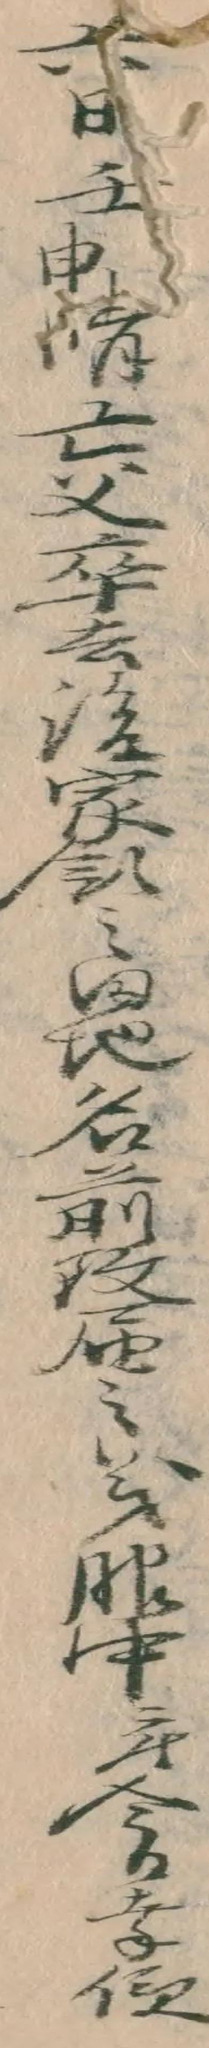六日壬申晴亡父卒去後家領之田地名前改届之義服中ニ付今日季便
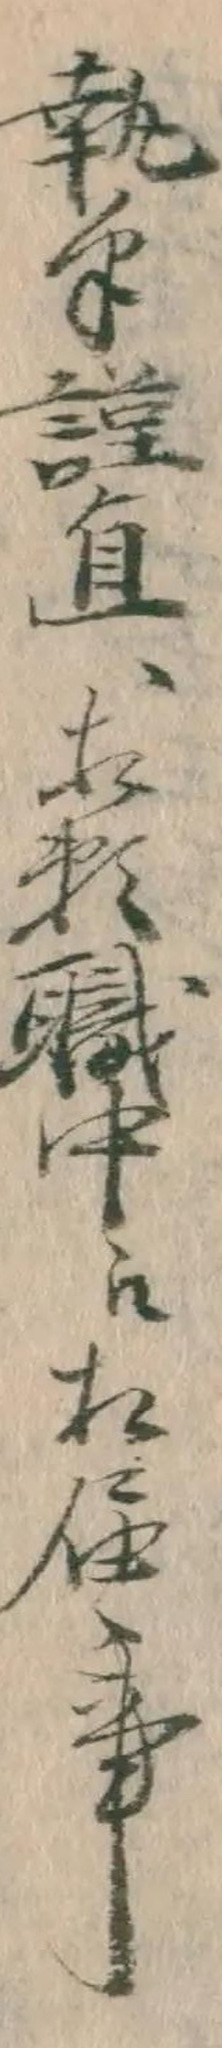執筆謹直へ相頼職中え相届候事
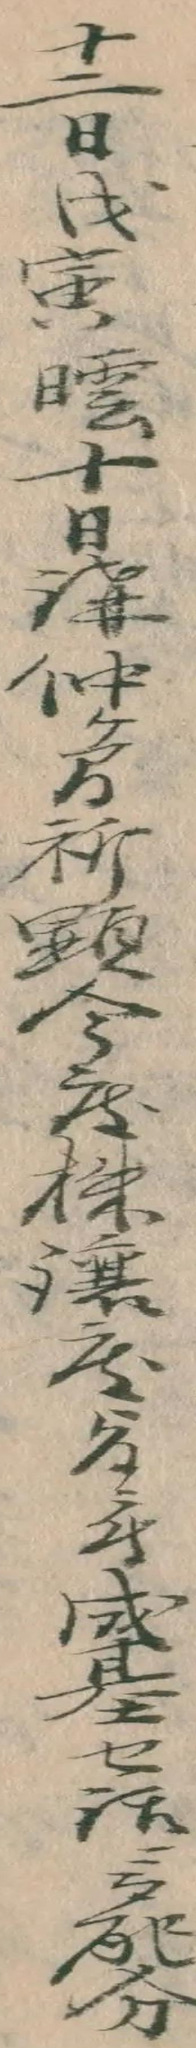十二日戊寅曇十日講仲ヶ間祈顕今度株譲度旨ニ付成基世話ニ而配分
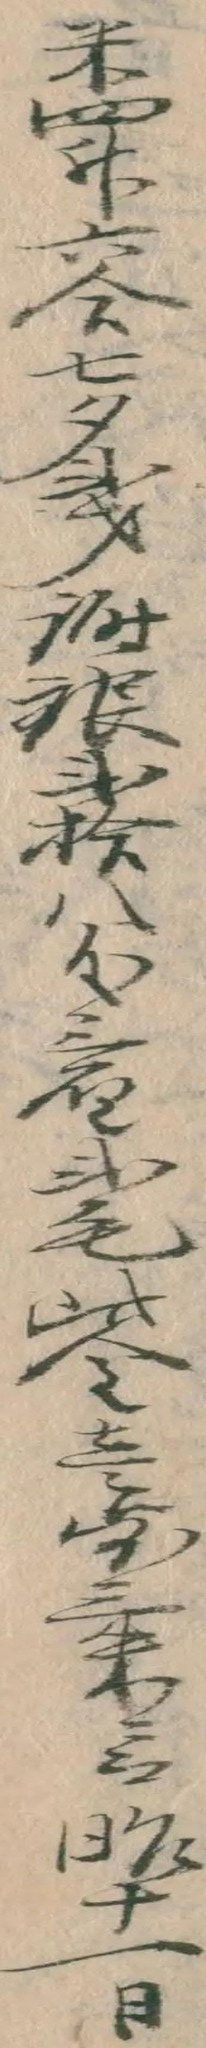米四升六合七勺弐才附銀弐拾八匁三厘弐毛此金壱歩三朱ニ而昨十一日
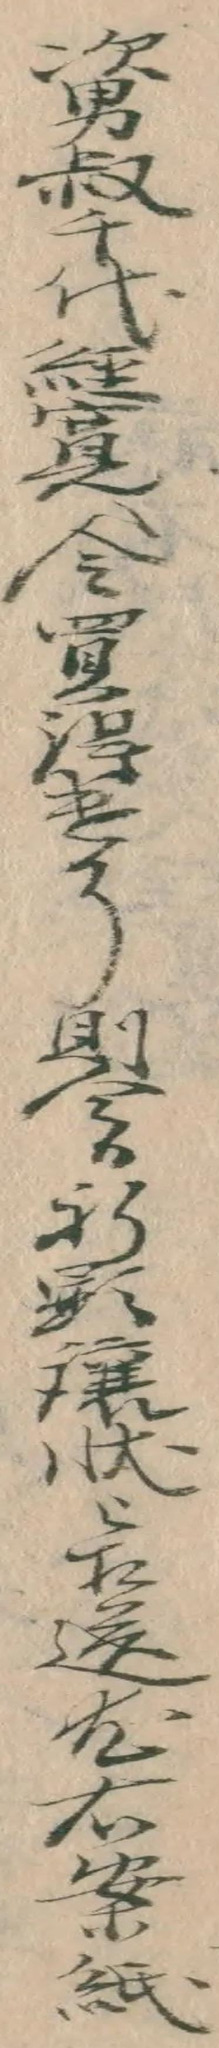次男叔千代経寛へ令買得遣了則今日新顕譲状被相送尤右案紙
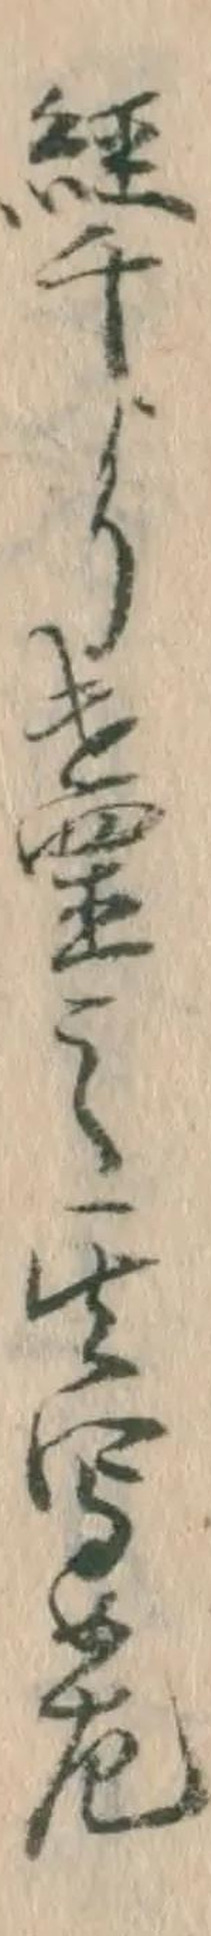経千より遣置之其写如左
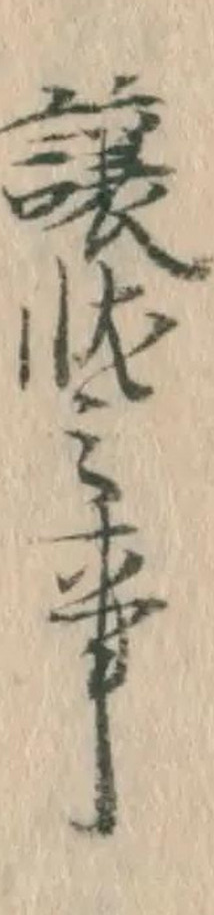譲状之事
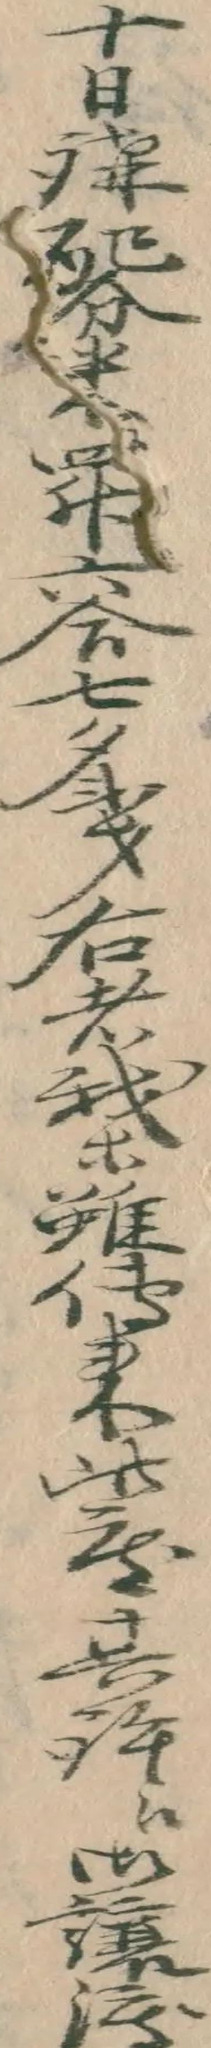十日配分米四升六合七夕弐才右者我等難傳来此度其許江御譲渡
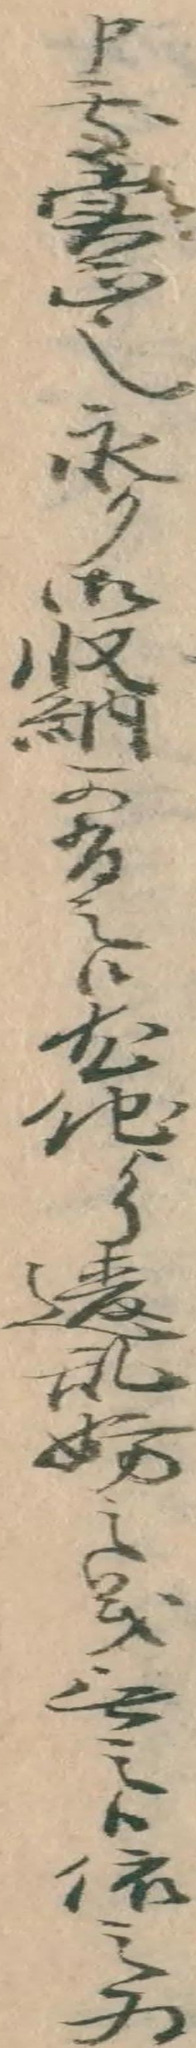申處実正也永ク御収納可有之候尤他より違乱妨之義無之候依之為

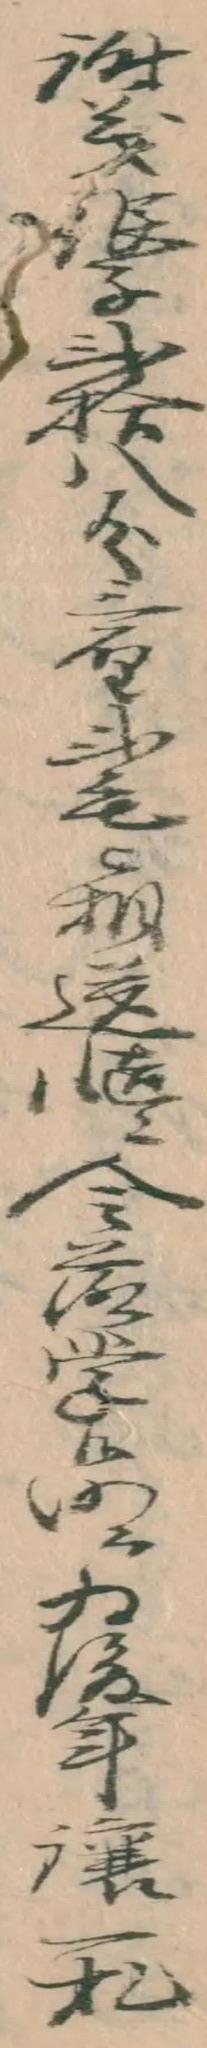附義銀子弐拾八匁二厘弐毛被相送慥ニ令落掌候仍而為後年譲一札
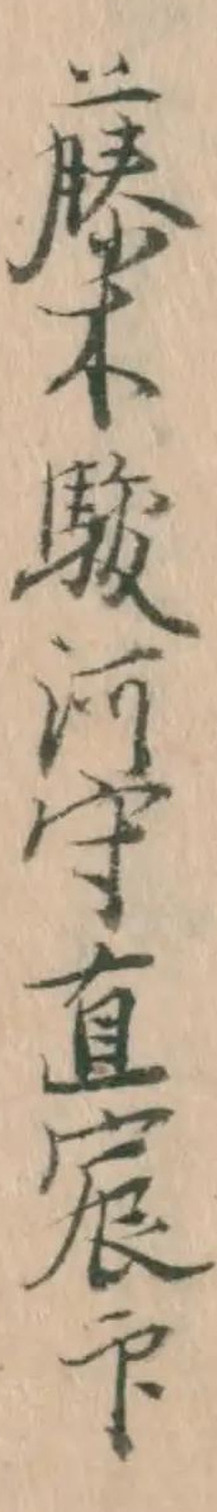藤木駿河守直宸印
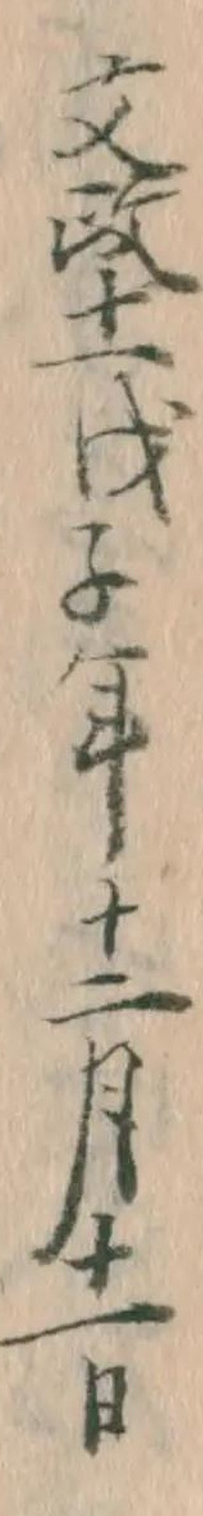文政十一戊子年十二月十一日
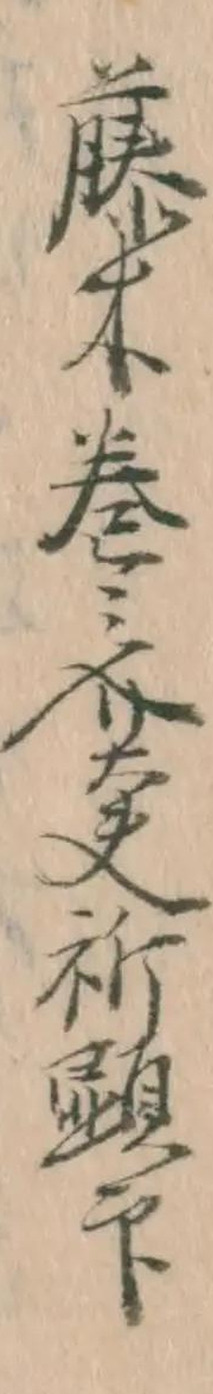藤木巻之介大夫祈顕印
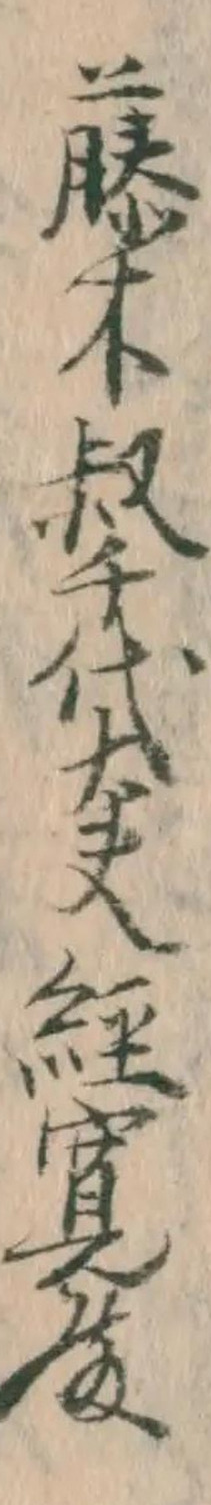藤木叔千代大夫経寛殿
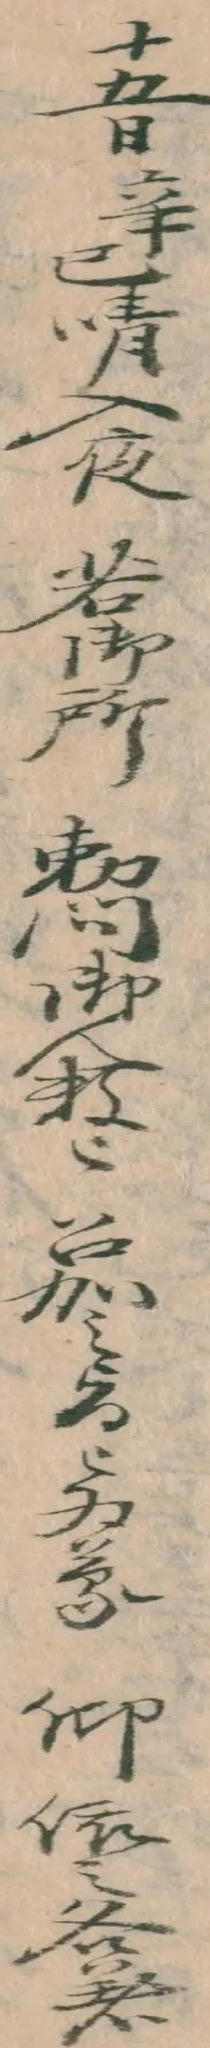十五日辛巳晴入夜若御所勅問御人数被召加之旨被為蒙仰依之各着
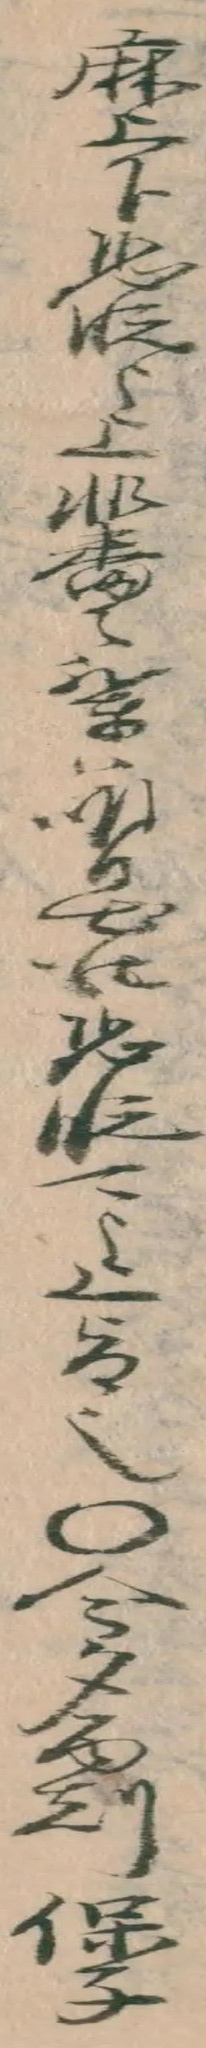麻上下恐悦申上非番之輩ハ明日出仕恐悦可申上旨也○今夕酉刻保子
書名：賀茂社記録. 第65冊
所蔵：国立国会図書館 National Diet Library, JAPAN
